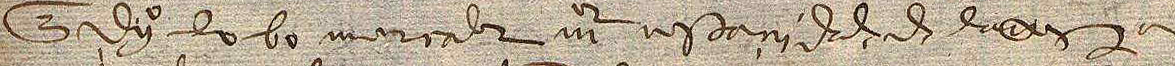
item dyo lobo mercador mor nesta çidade de lagos ta
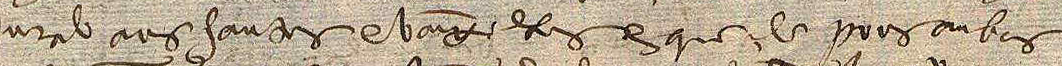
Jurado aos Santos evāngelhos en que ele poos ambas
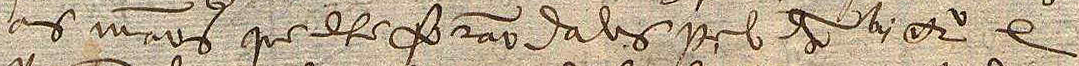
as mãos que lhe forão dados pelo d̄to vigro e
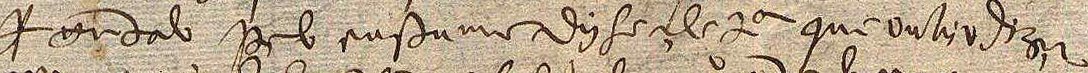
ꝑgūtado pelo custume dyse ele ta que ouviu dizer
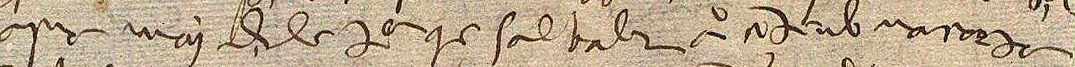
a sua maj dele ta qe Salvador ao cōteudo na carta
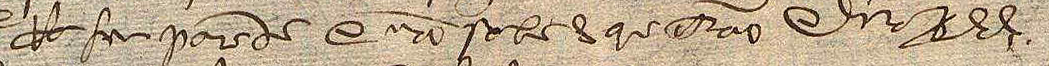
eRa seu pārete e não sabe en qe grāo e dira ꝟdade
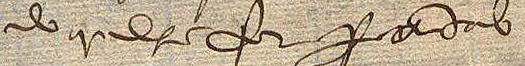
do que lhe for ꝑgūtado
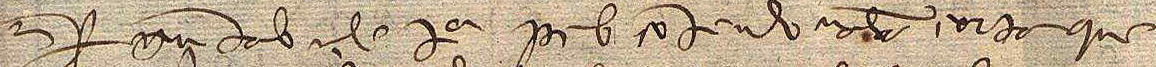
item ꝑgūtado ele ta pelo cōteudo na d̄ta carta que
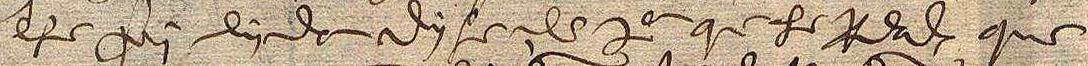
lhe foy lyda dyse ele ta que he ꝟdade que
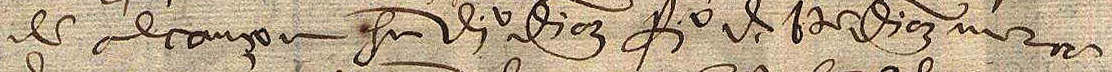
ele alcansou hū dyo d̄iaz fjo de vte d̄iaz mora
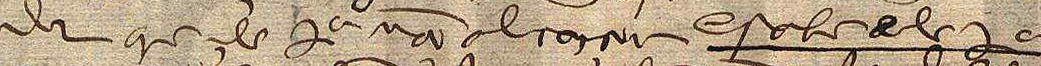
dor qe ele ta não alcacçou e sabe ele ta
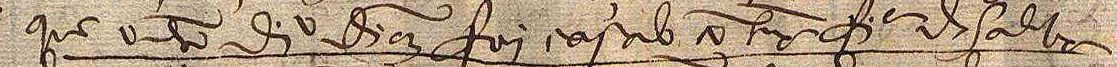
que o d̄to dio d̄iaz foj casado cō hūa fia de Salva
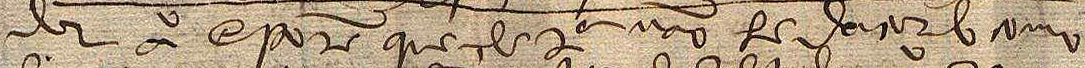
dor ao e porē que ele ta não he dacordo como
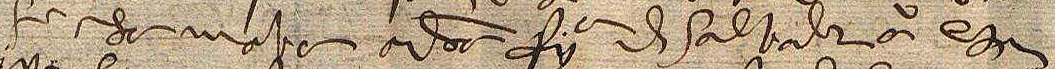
se chamava a d̄ta fya de Salvador ao e tem
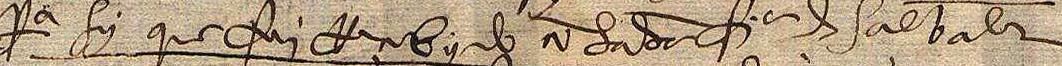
pa Sy que foj Reçebydo cō ha d̄ta fia de Salvador
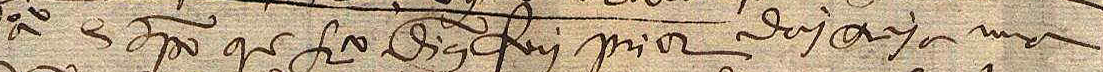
ao en t̄po que frco d̄iaz foy prior da jgreja ma
